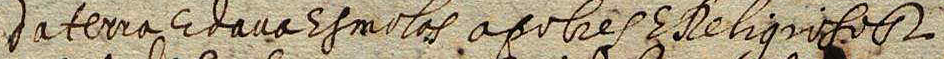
da terra E daua Esmolas a pobres E Religiosos
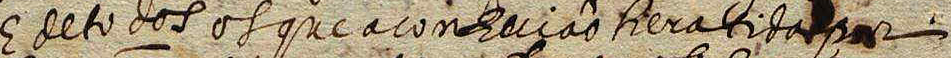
E de todos os que a conhecião hera tida por
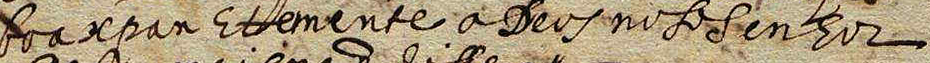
boa xp̄an E temente a Deos noso senhor
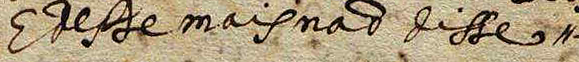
E deste mais naõ disse // -
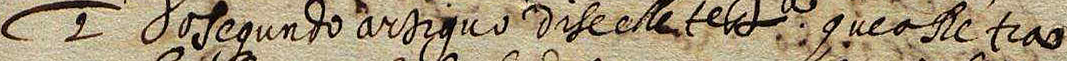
item Do segundo artiguo dise elle testa. que a Ré tra
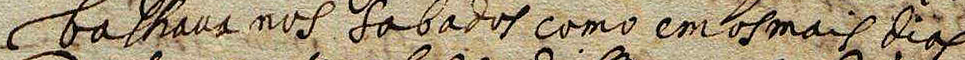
balhaua nos sabados como em os mais dias
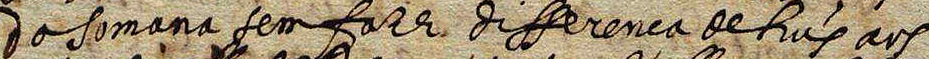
da somana sem fazer differença de hūs aos
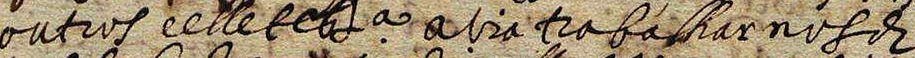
outros e elle testa. a via trabalhar nos di
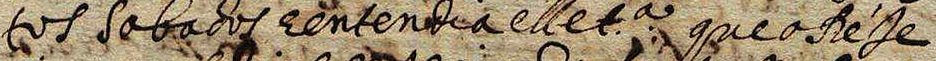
tos sabados E entendia elle t.a que a Ré Je
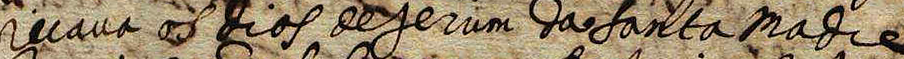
iuaua os dias de jeium da santa madre
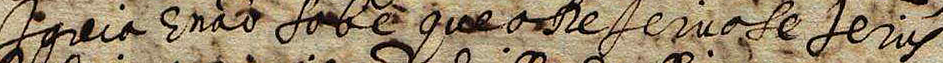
Jgreia E não sabe que a Re Jeiuase Jeiūs
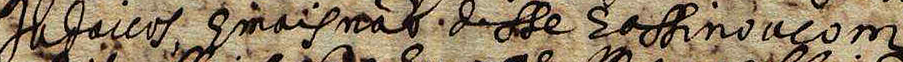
Judaicos, E mais não disse E assinou com
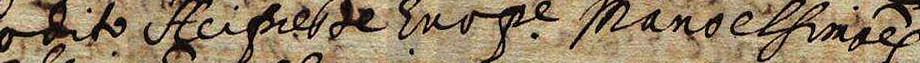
o dito Acipreste Eu o p.e Manoel simoẽs
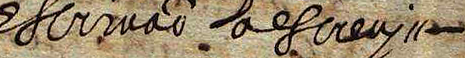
Escriuaõ a escreuj // -
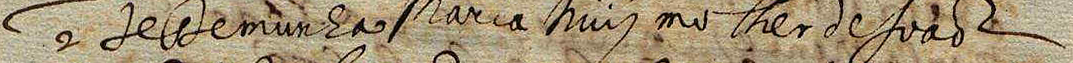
item testemunha Maria Nuīz molher de Joaõ
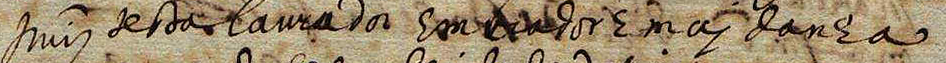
Nuīz testa laurador E morador Em a Idanha
